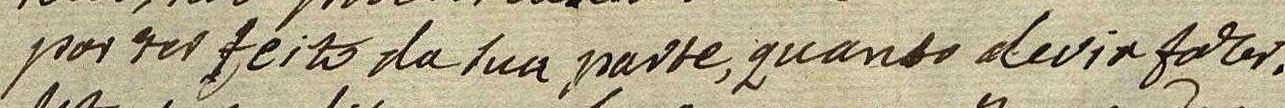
por ter feito da sua parte, quanto devia fazer.
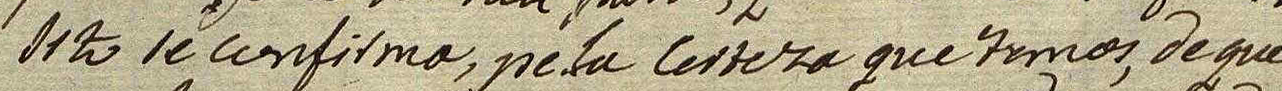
Isto se confirma, pela certeza que temos, de que
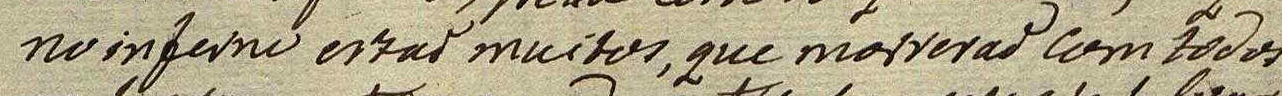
no inferno estaõ muitos, que morreraõ com todos
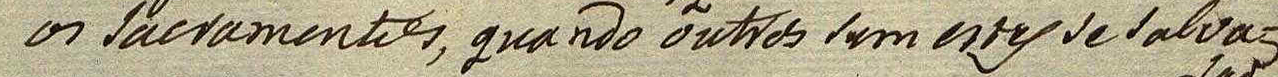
os sacramentos, quando outros sem estes se salva
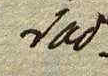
raõ.
